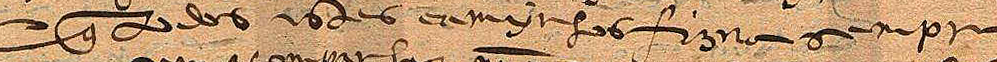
e q̅ todos estes camynhos fizera sempre
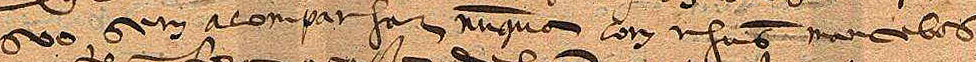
soo sem acompanhar nu̅qua com nhu̅s mancebos
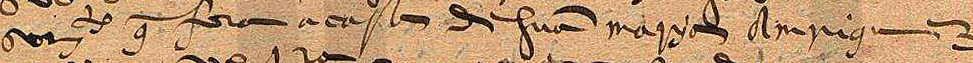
somte q̅ fora a casa de hu̅a marya Amriquez
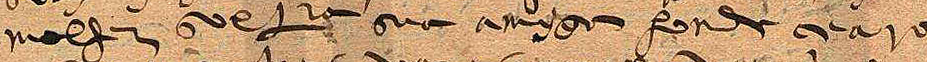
molher soltra sua amyga honde çeara
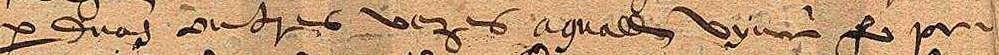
ꝑ duas outras vezes a quall vyue ho pe
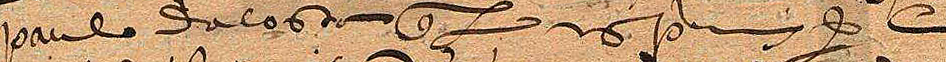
paulo da costa q̄ ho espruy. e
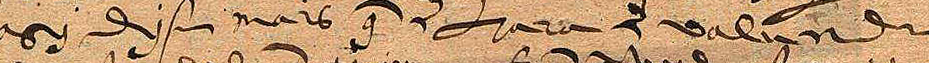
asy dyse mais q̅ e̅trara e̅ valuerde
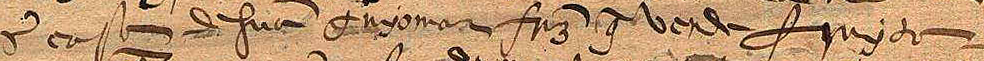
e̅ casa de hu̅a guyomar frz̅ q̅ vende fruyta
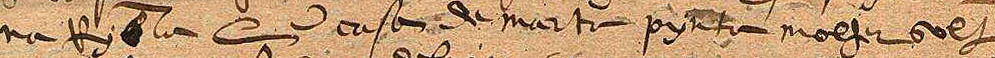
na Rybra e e̅ casa de marta pynta molher solt
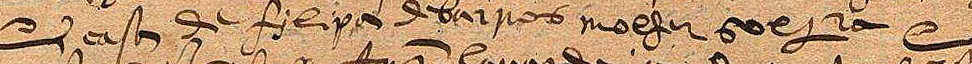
e e̅ casa de fylipa de bairros molher soltra e e̅
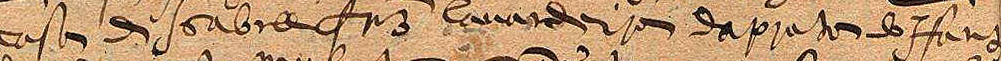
casa de Jsabell frz̅ lauandeira da prata do Jfant
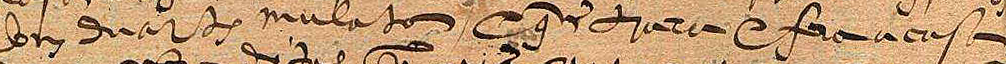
dom duarte mulato / e q̅ e̅trara e fora a casa
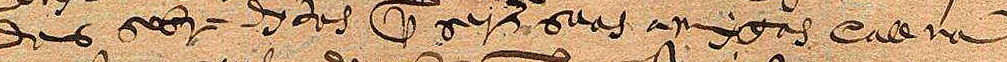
das sobredytas p̄o sere̅ suas amygas e all na̅
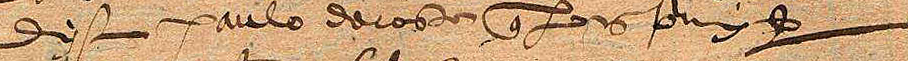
dyse paulo da costa q̅ ho esp̄iuy.
